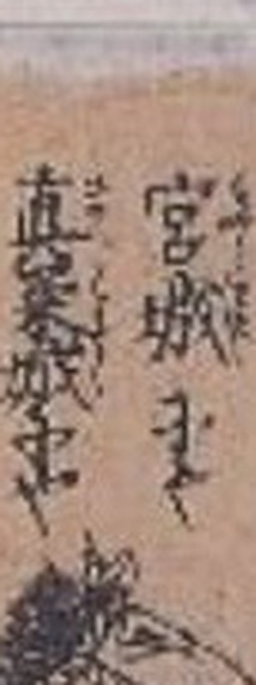真栄城にや
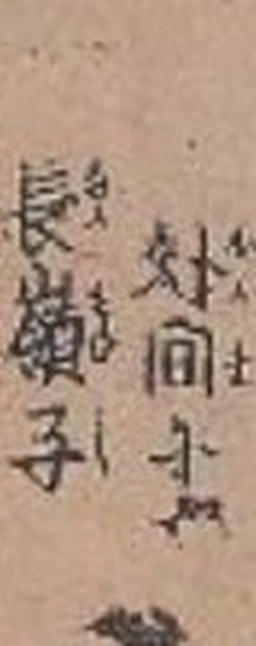長嶺子
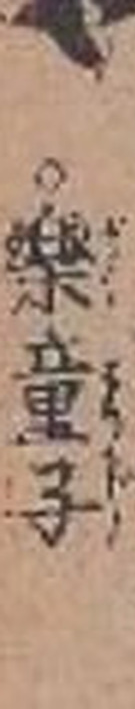○楽童子
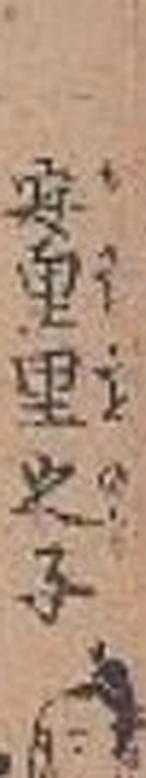安里里之子
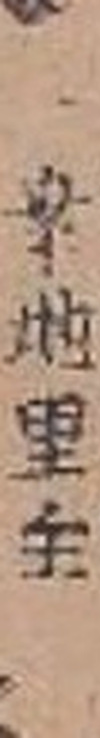幸地里主
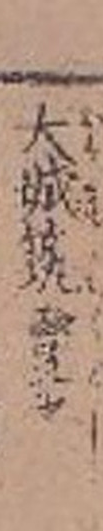大城筑登之
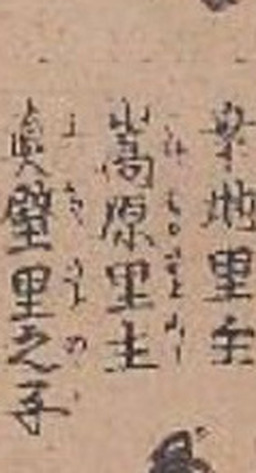嵩原里主
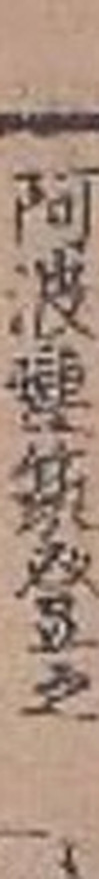阿波連筑登之
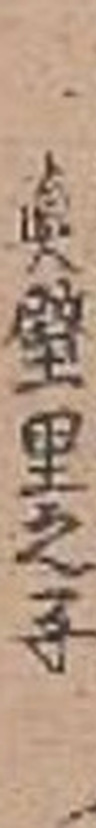真壁里之子
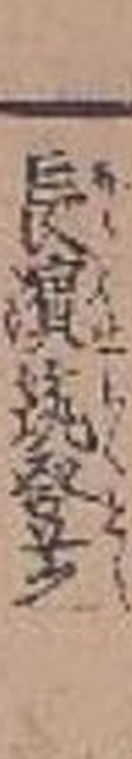長濱筑登之
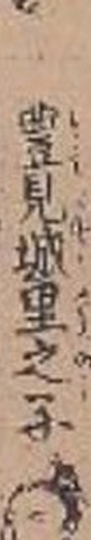豊見城里之子
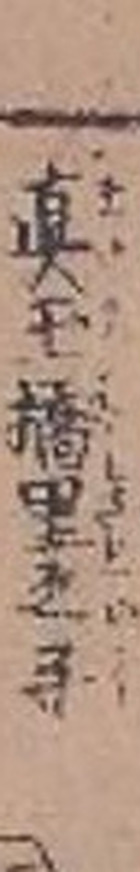真玉橋里之子
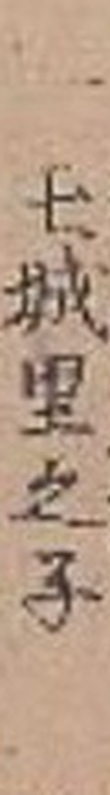玉城里之子
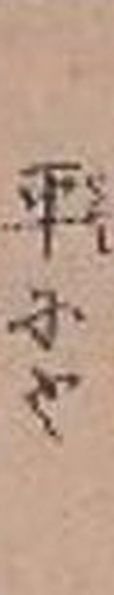平にや
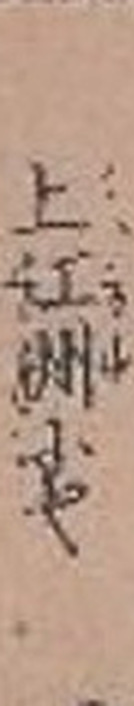上江洲にや
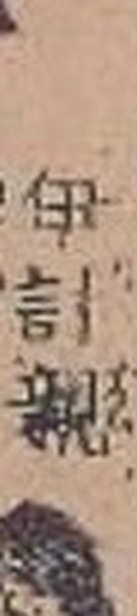伊計親
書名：琉球人行列附 天保十三壬寅年十一月
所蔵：University of the Ryukyus Library
